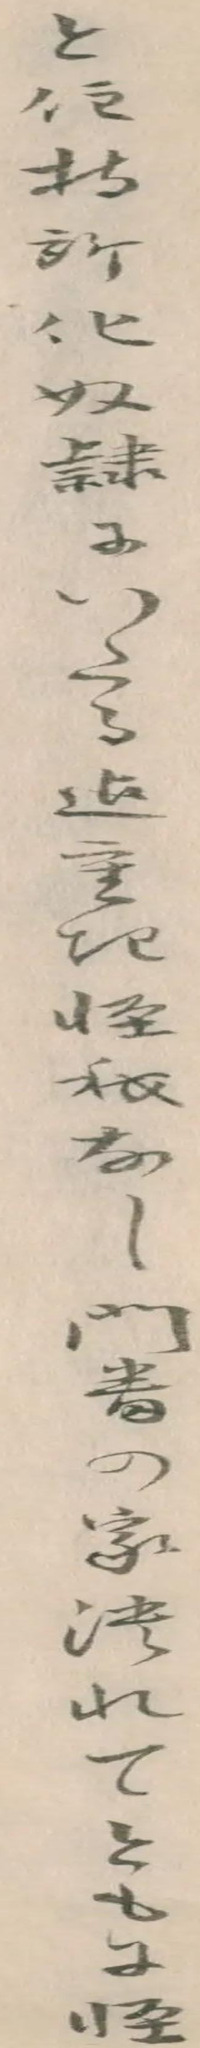と住持所化奴隷にいたる迄重き怪我なし門番の家潰れてともに怪
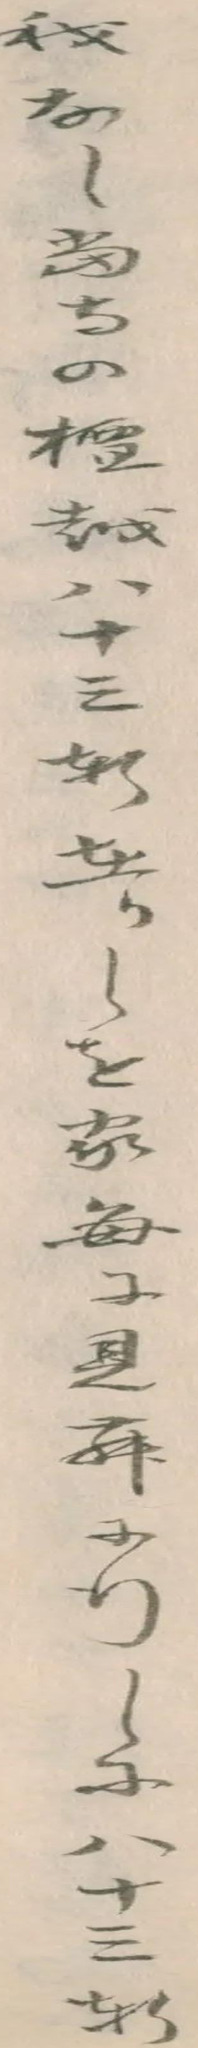我なし当寺の檀越八十三軒在りしを家毎に見舞に行しに八十三軒
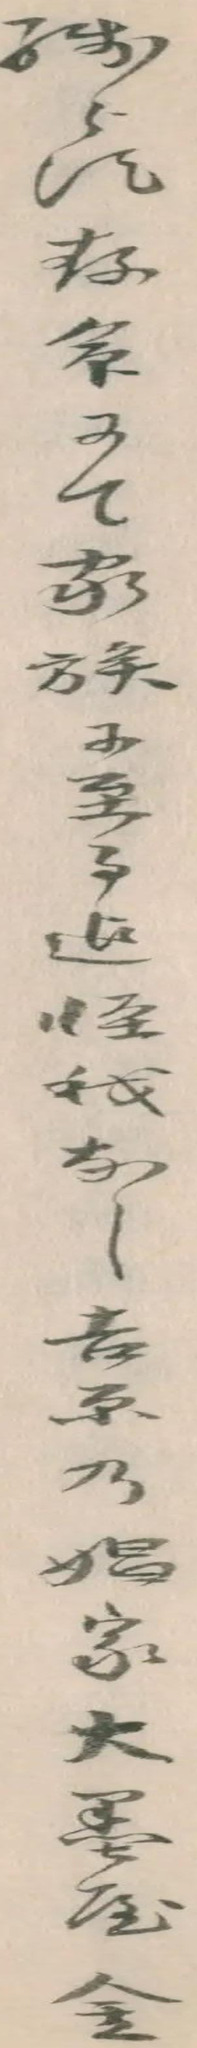残らす存命にて家族に至る迄怪我なし吉原の娼家大墨屋金
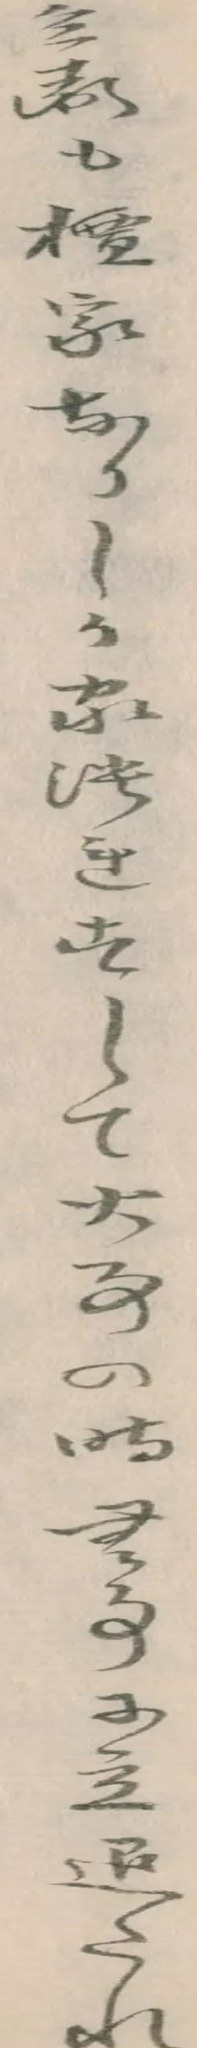兵衛も檀家なりしか家潰れすして火事の時無事に立退たれ
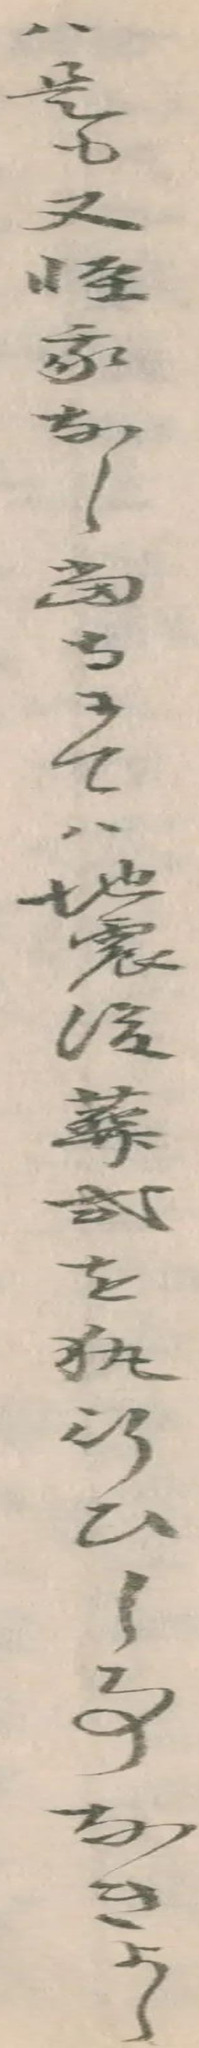は是も又怪我なし当寺にては地震後葬式を執行ひし事なきよし
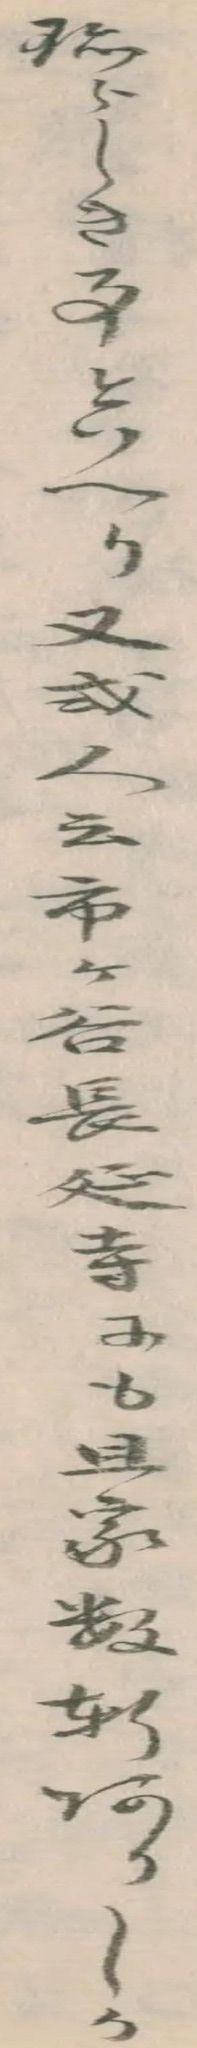珍らしき事といへり又或人云市ヶ谷長延寺にも旦家数軒ありしか
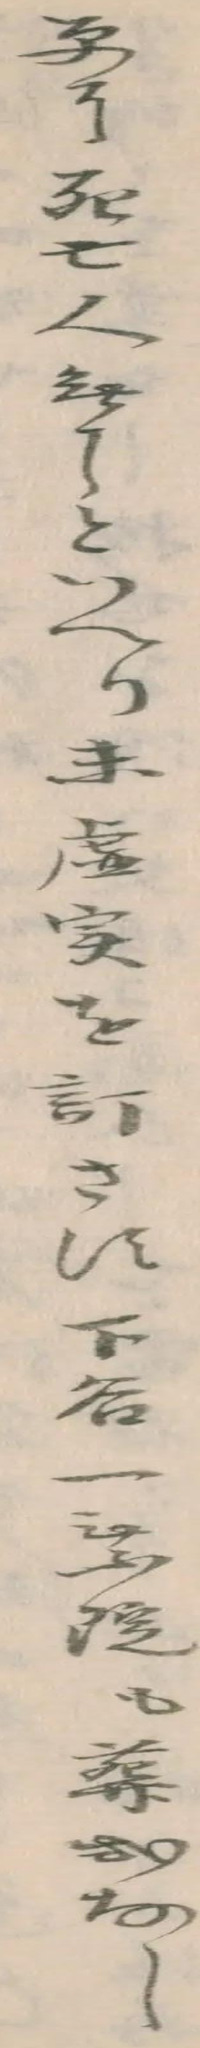更に死亡人無しといへり未虚実を訂さす下谷一乗院も葬式なし
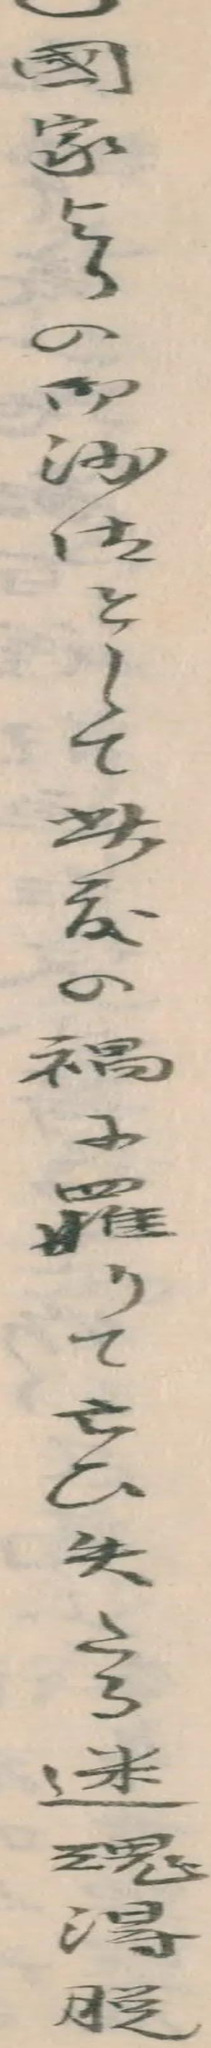〇国家よりの御沙汰として此度の禍に罹りて亡ひ失たる迷魂得脱
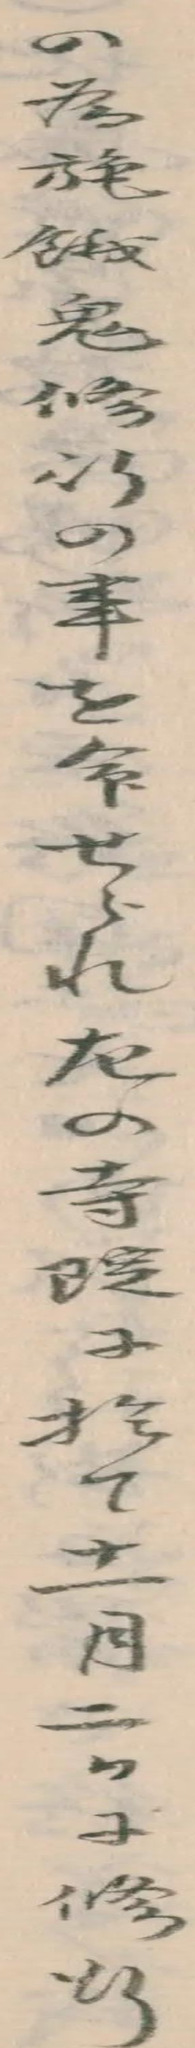の為施餓鬼修行の事を命せられ左の寺院に於て十一月二日に修行
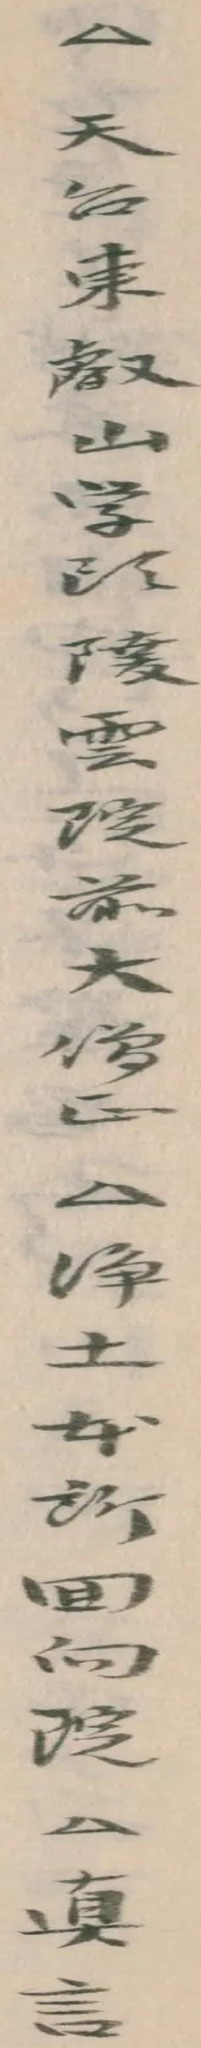△天台東叡山学頭陵雲院前大僧正△浄土本所回向院△真言
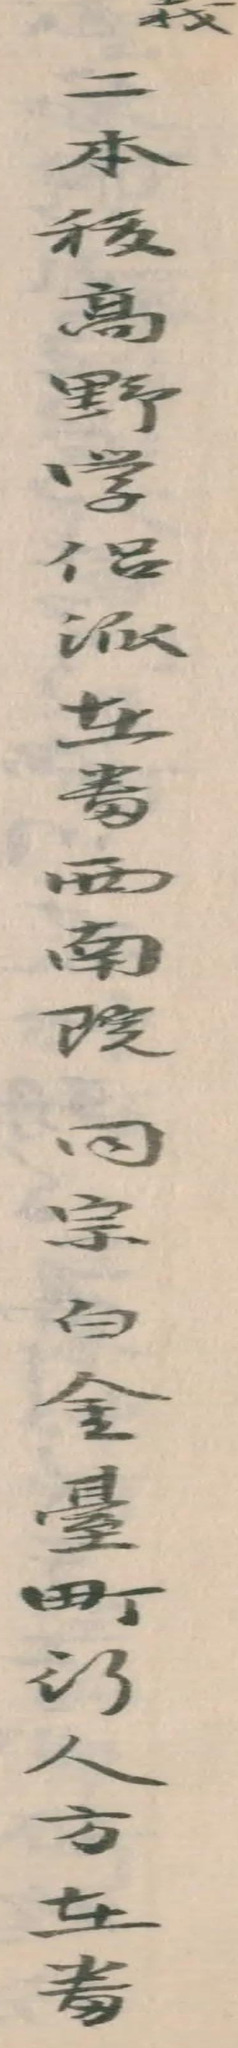古義二本榎高野學侶派在番西南院同宗白金台町行人方在番
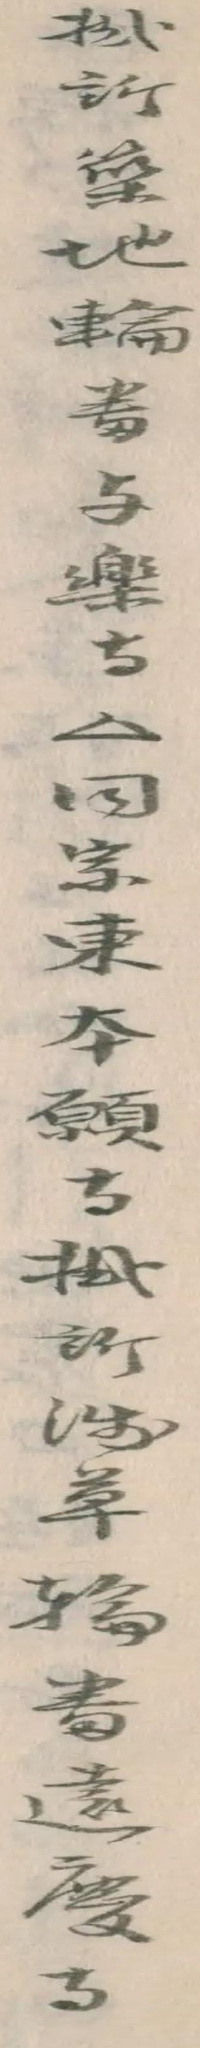掛所築地輪番与楽寺△同宗東本願寺掛所浅草輪番遠慶寺
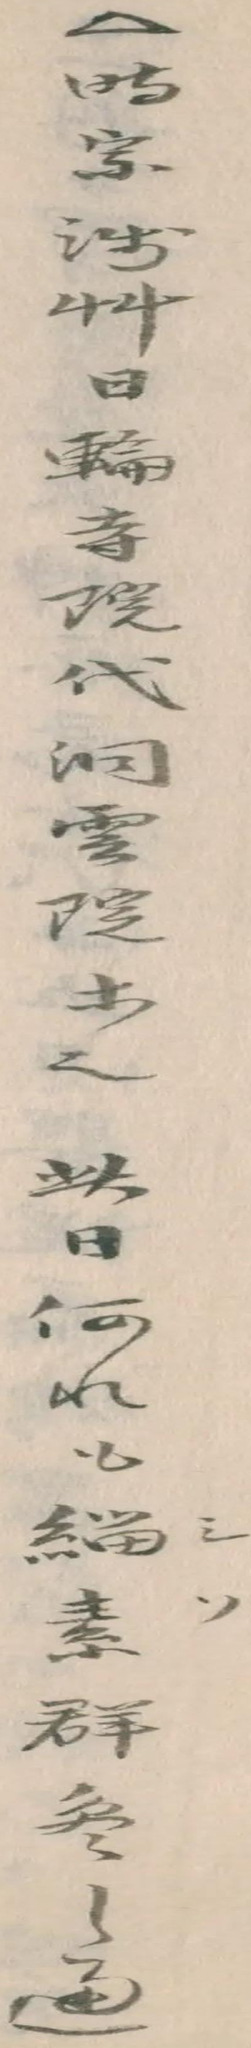△時宗浅草日輪寺院代洞雲院等也此日何れも緇素群参し通
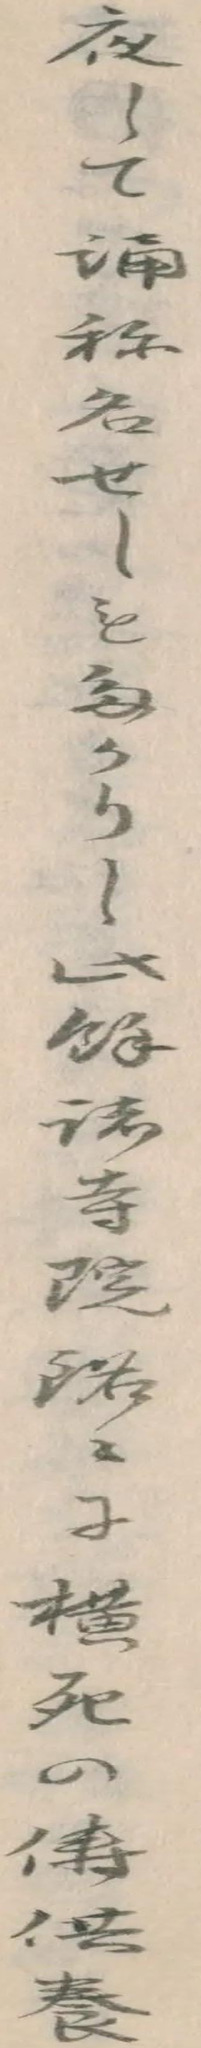夜して誦称名せしも多かりし此余諸寺院銘々に横死のの儔供養
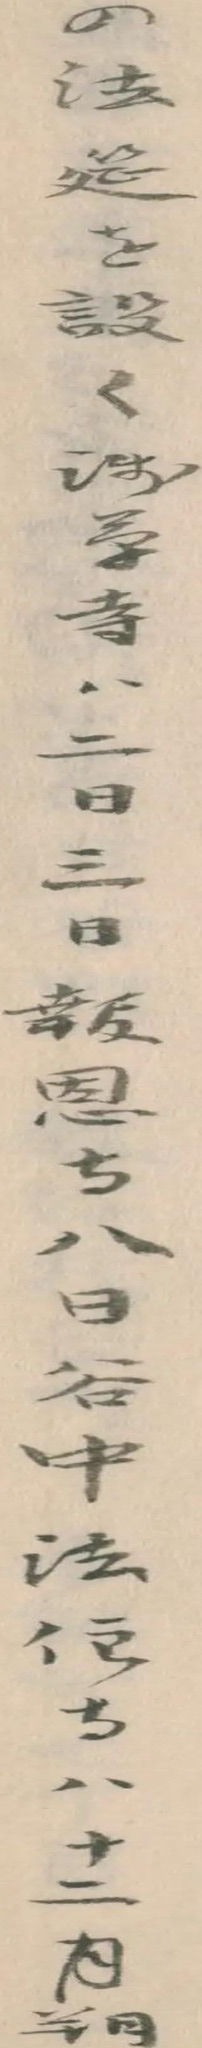の法筵を設く浅草寺は二日三日法恩寺八日谷中法住寺は十二月朔

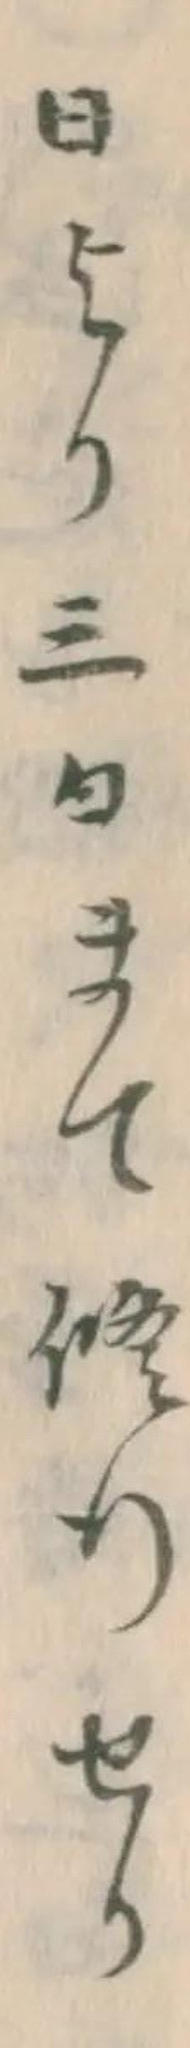日より三日まて修行せり
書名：地災撮要. 巻7-9(地震之部)
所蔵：国立国会図書館 National Diet Library, JAPAN
